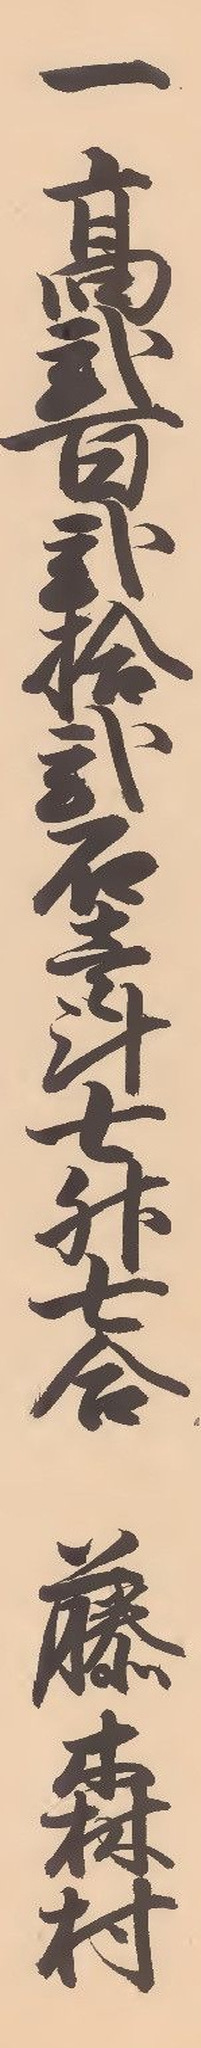一高弐百弐拾弐石壱斗七升七合藤森村
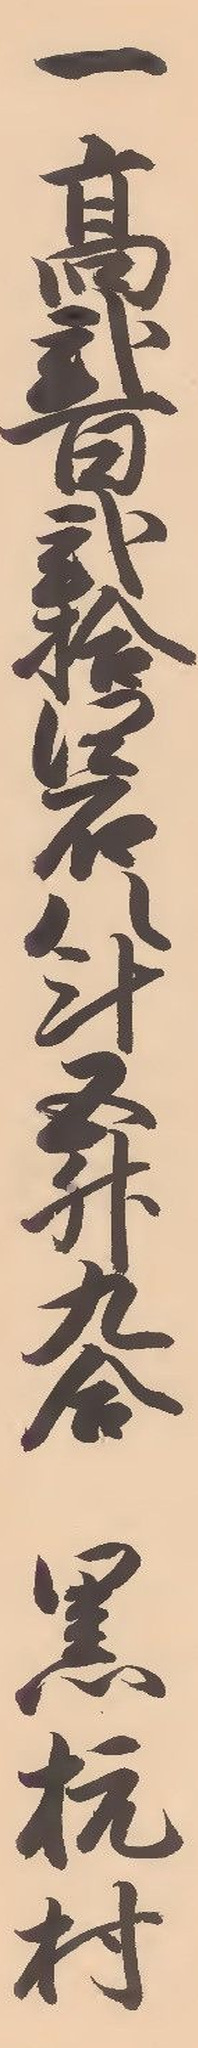一高弐百弐拾四石八斗五升九合黒杭村

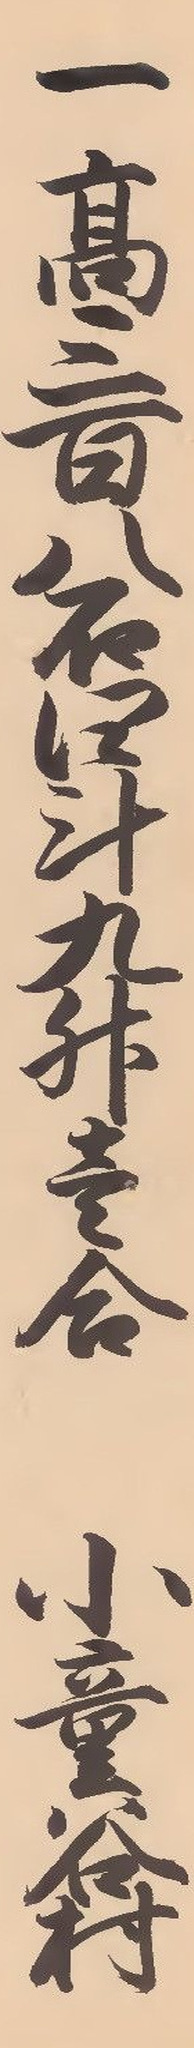一高三百八石四斗九升壱合小童谷村
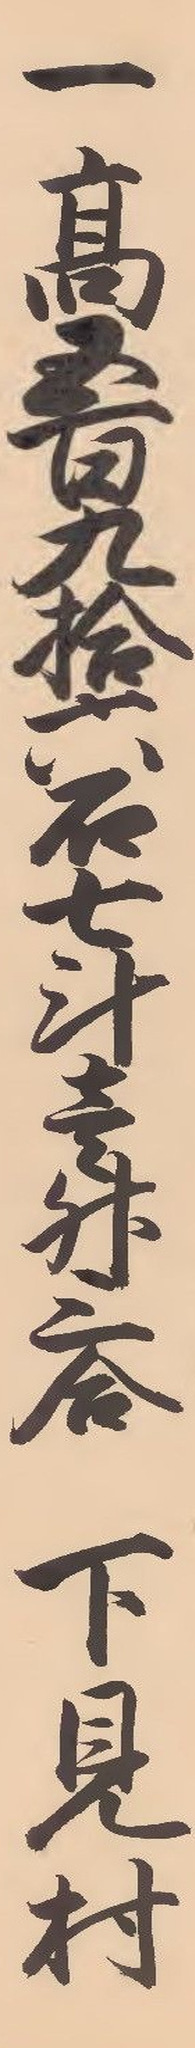一高五百九拾六石七斗壱升三合下見村
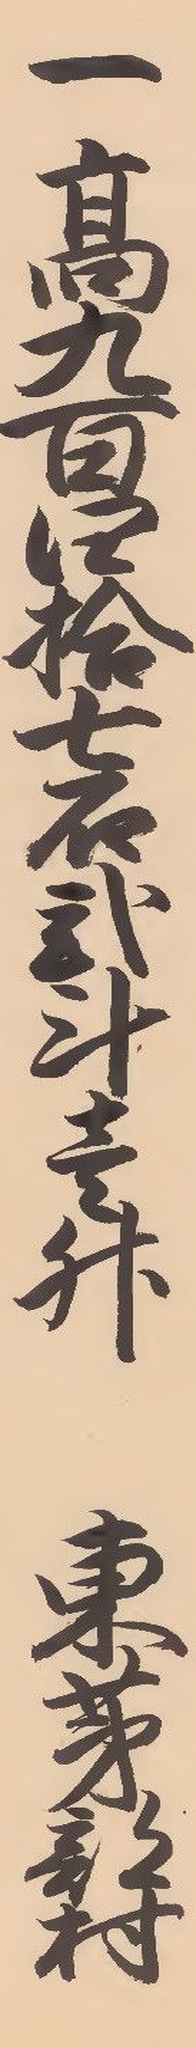一高九百四拾七石弐斗壱升東茅部村
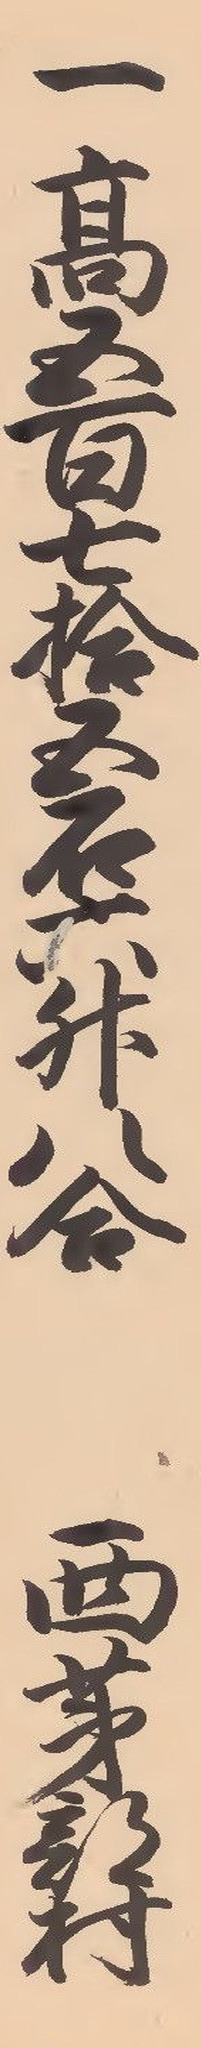一高五百七拾五石六升八合西茅部村
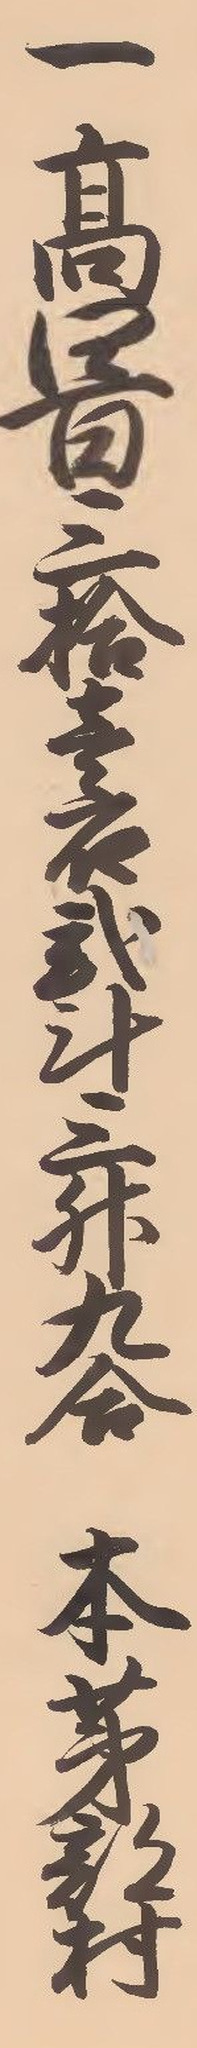一高四百三拾壱石弐斗三升九合本茅部村
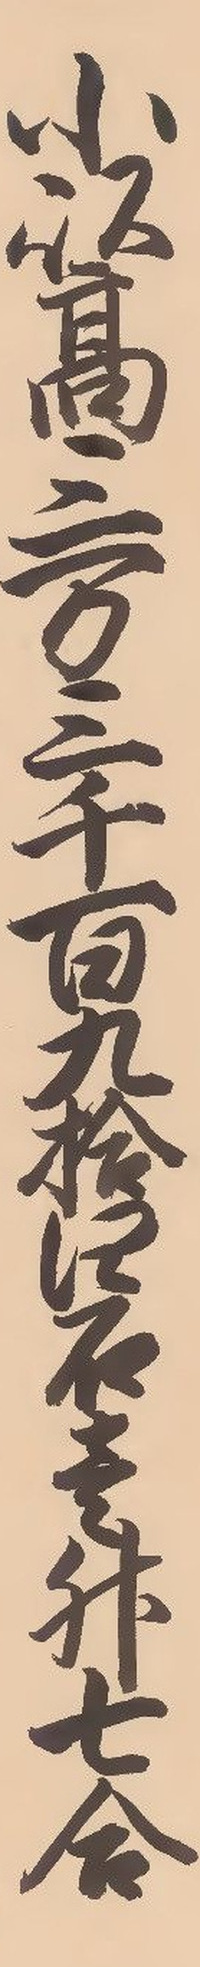小以高三万三千百九拾四石壱升七合

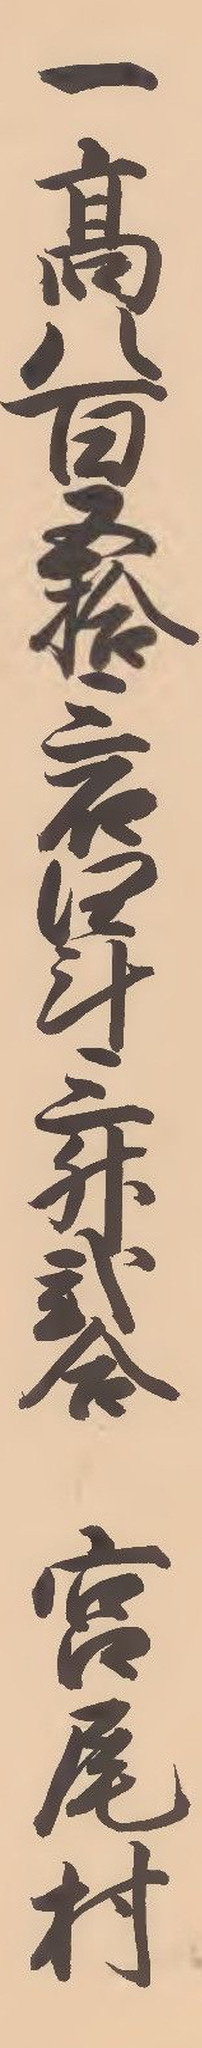一高八百五拾三石四斗三升弐合宮尾村
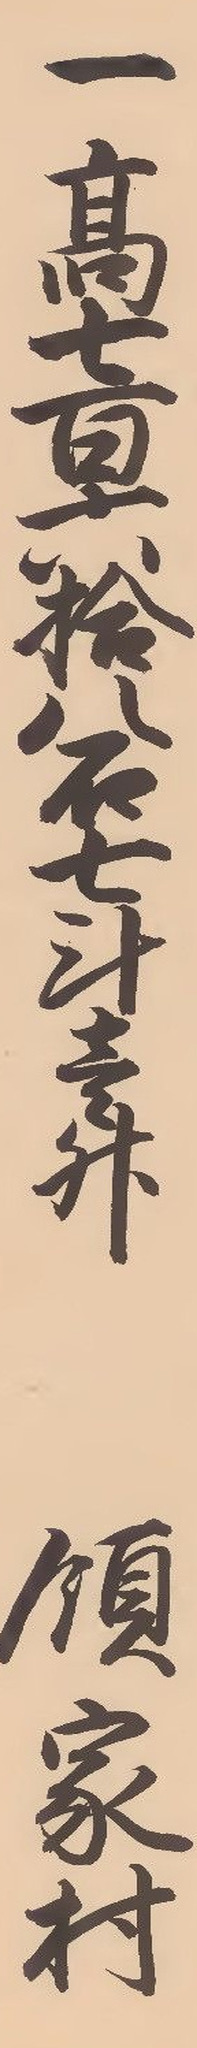一高七百六拾八石七斗壱升領家村
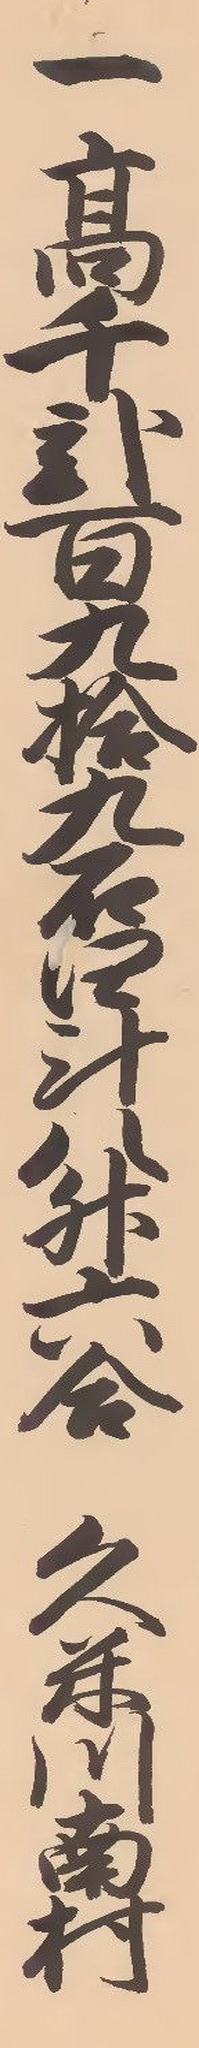一高千弐百九拾九石四斗八升六合久米川南村
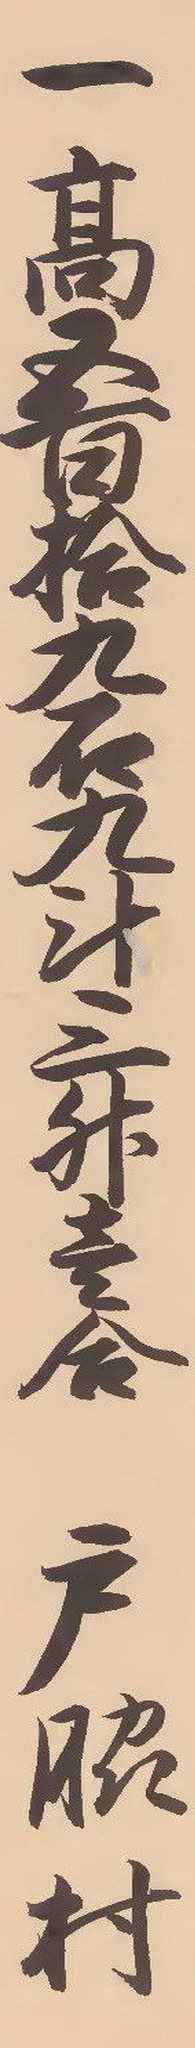一高五百拾九石九斗三升壱合戸脇村
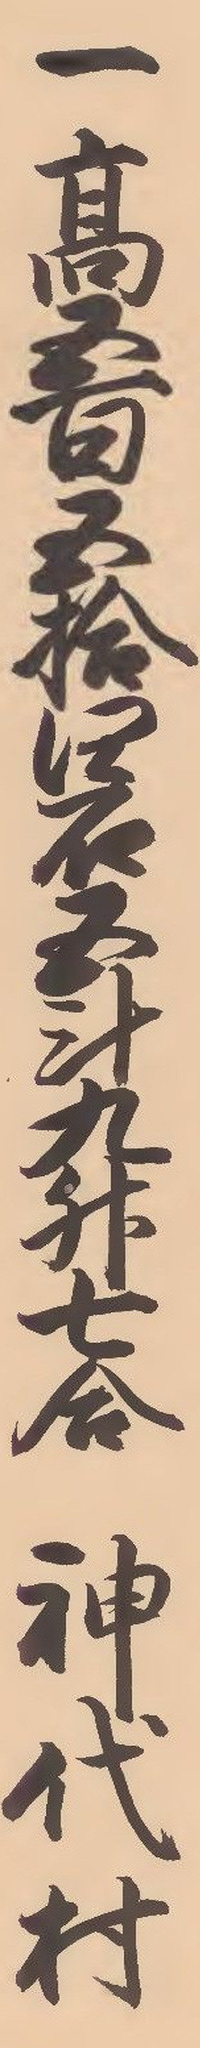一高五百五拾四石五斗九升七合神代村

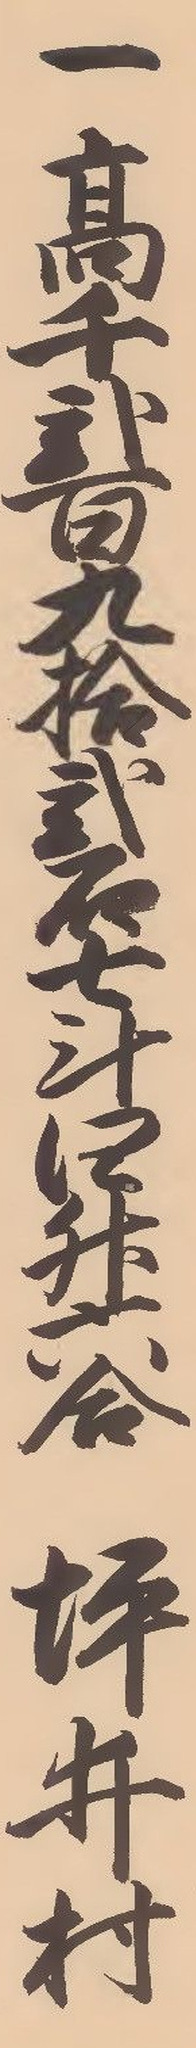一高千弐百九拾弐石七斗四升六合坪井村
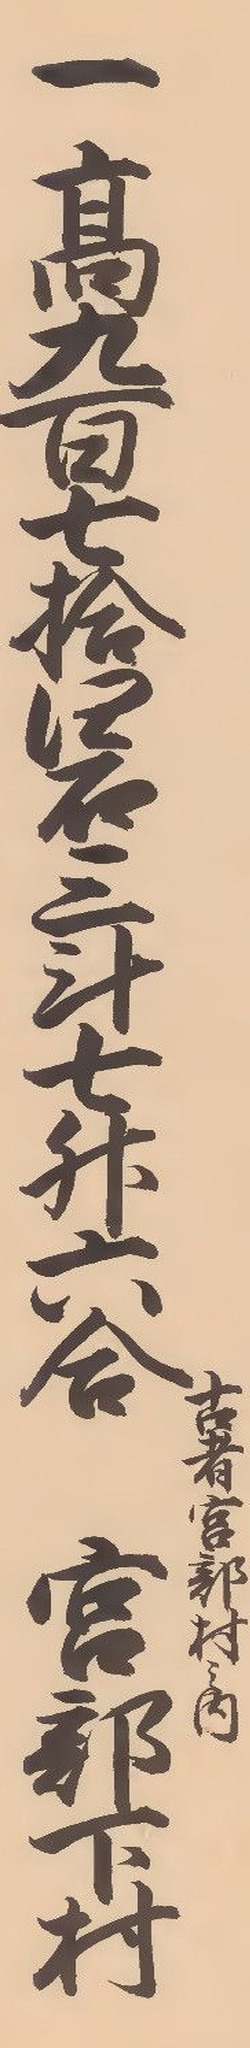一高八百九拾四石四斗七升七合中北下村
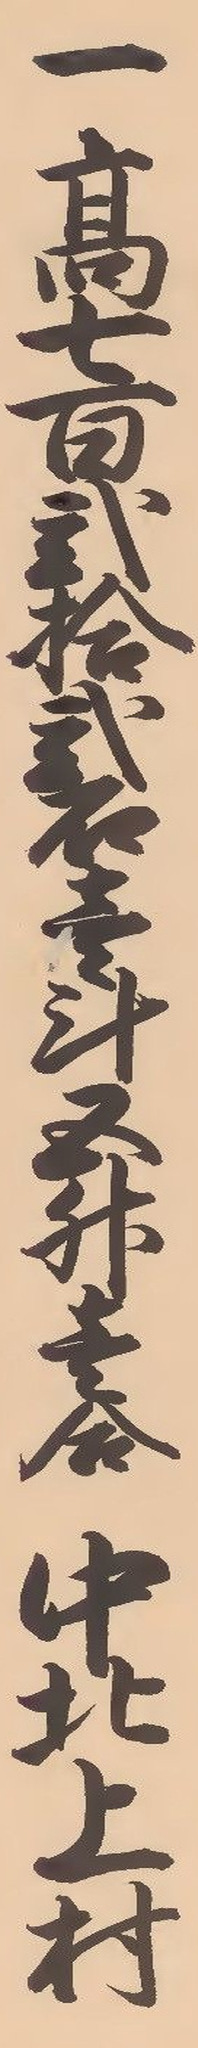一高七百弐拾弐石壱斗五升壱合中北上村
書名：美作国郷帳
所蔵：国立公文書館 National Archives of Japan
